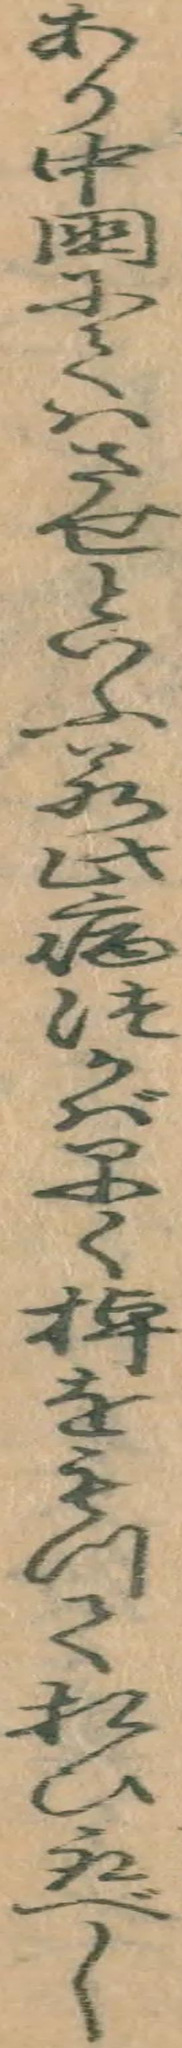あり中国にてはさせといふ若此病つかば早く棹をもつて払ひ取べし
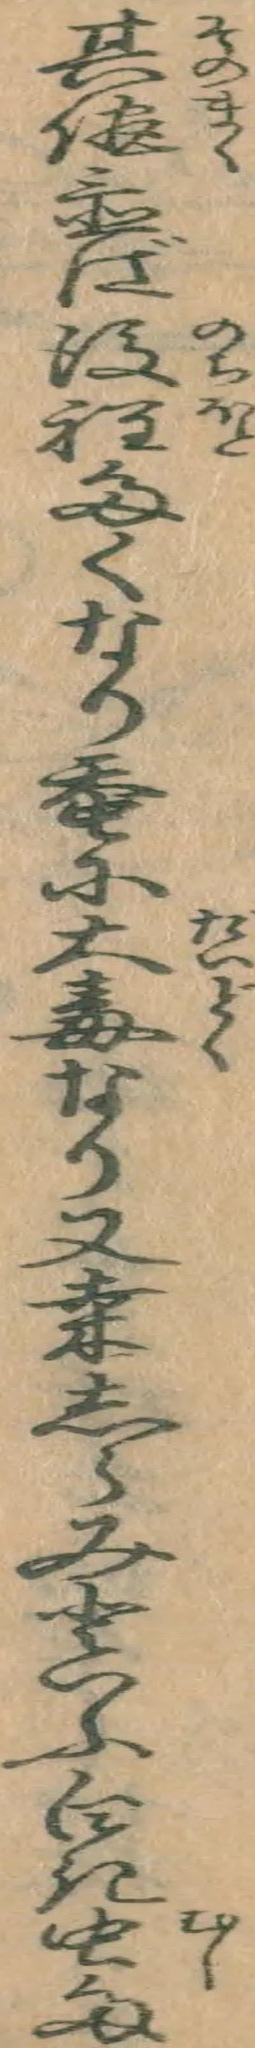其侭置ば後程多くなり蚕に大毒なり又桑しらみといふ白き虫多
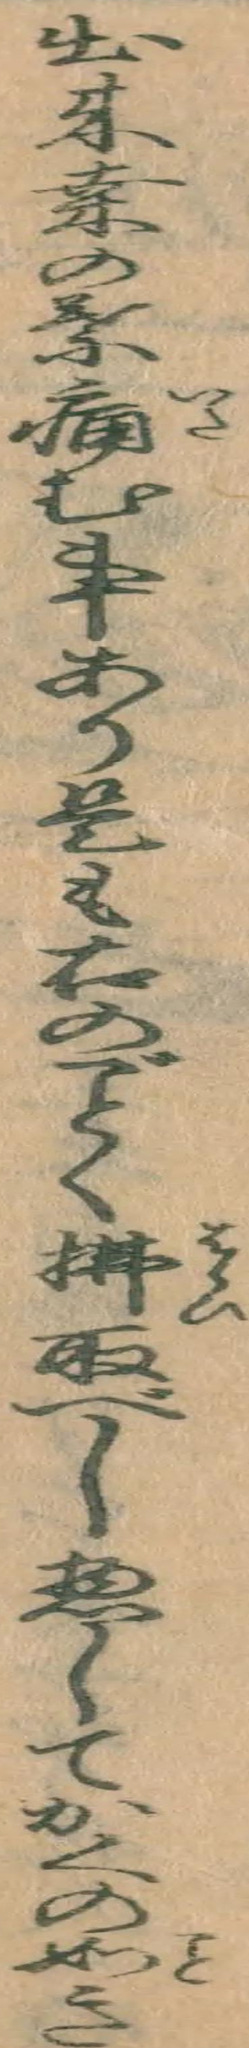出来桑の葉痛む事あり是も右のごとく払取べし惣してかくの如き
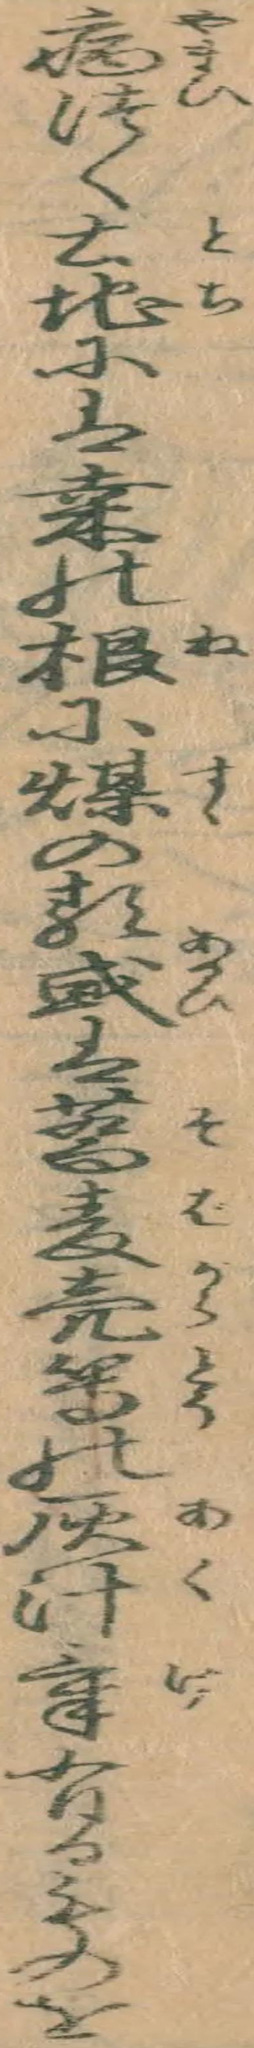病つく土地には桑の根に煤の類或は蕎麦壳等の灰汁気有るものを
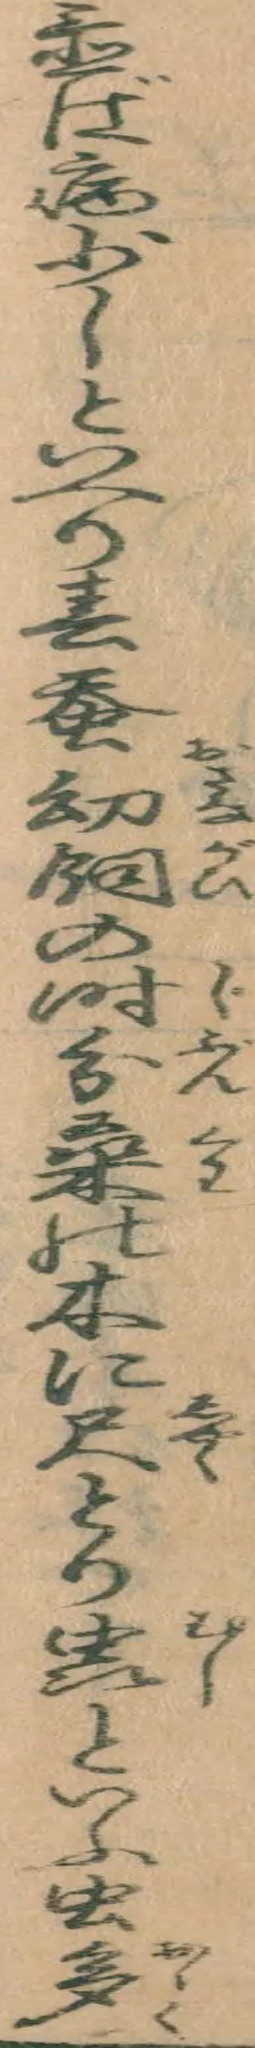置ば病少しといへり春蚕幼飼の時分桑の木に尺とり虫といふ虫多
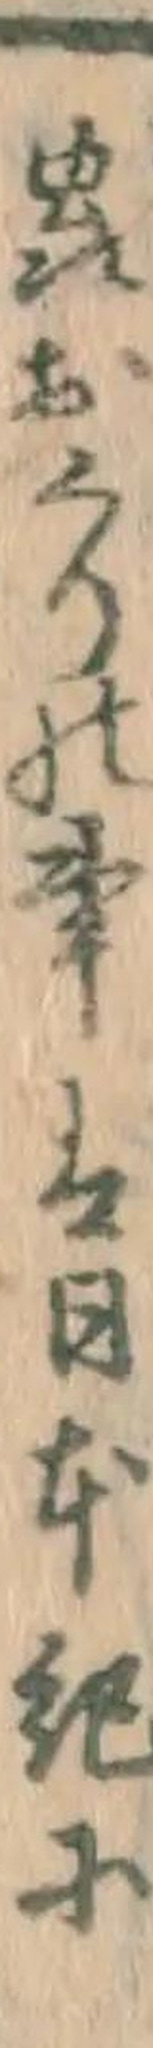虫おくりの事は日本紀に
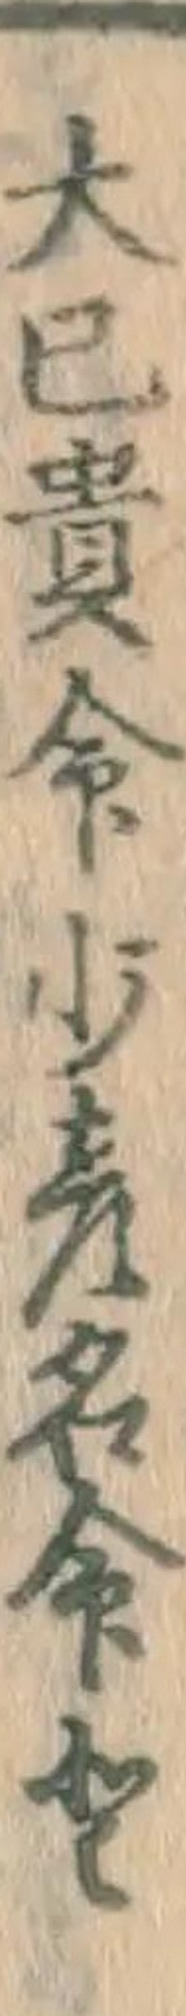大已貴尊少彦名命と
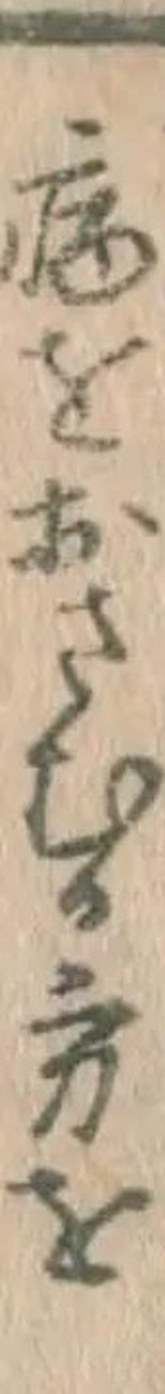病をおさむる方を
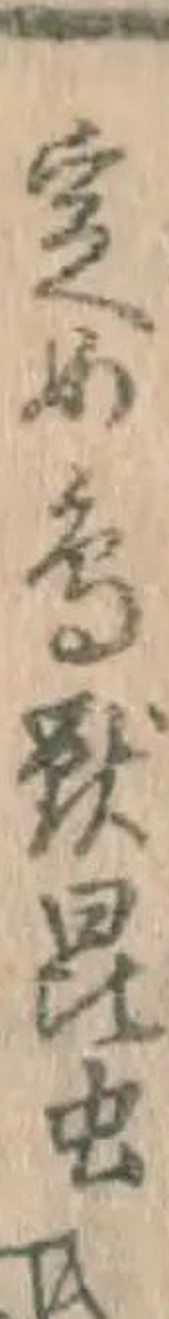定め鳥獣昆虫
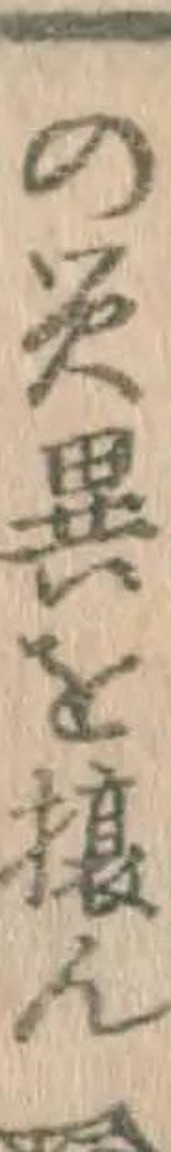の災異を攘ん
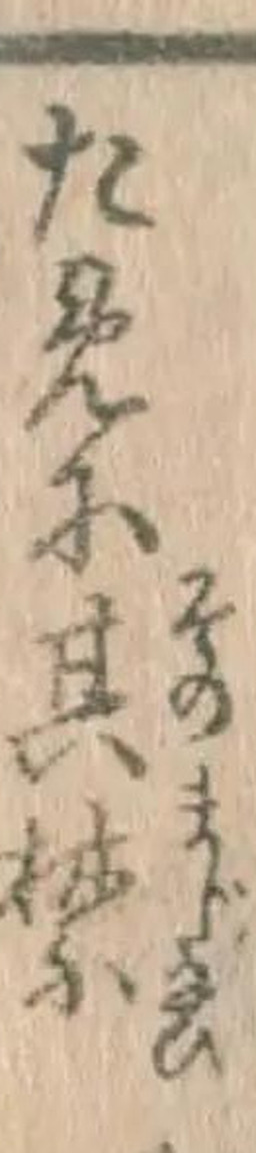ために其禁
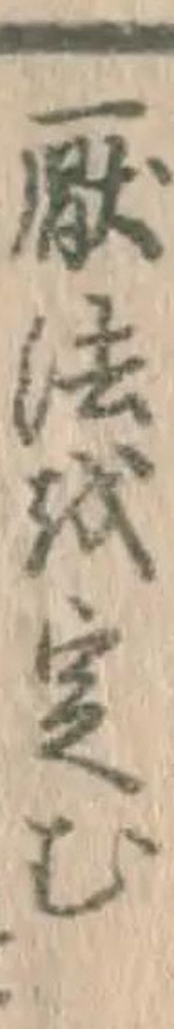厭法を定むと
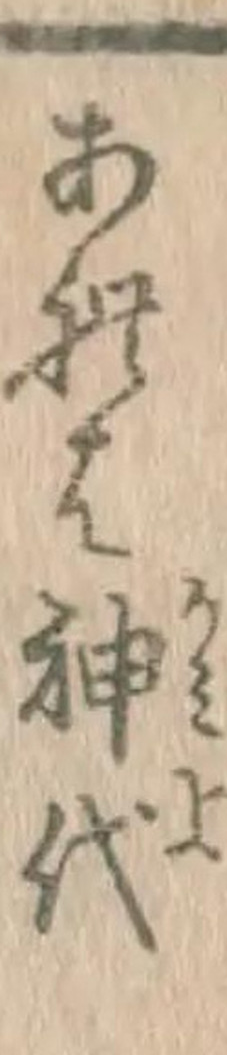あれは神代
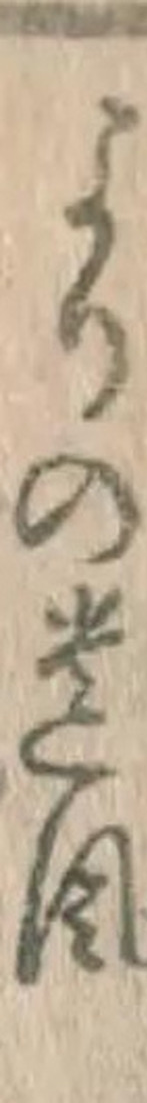よりの遺風
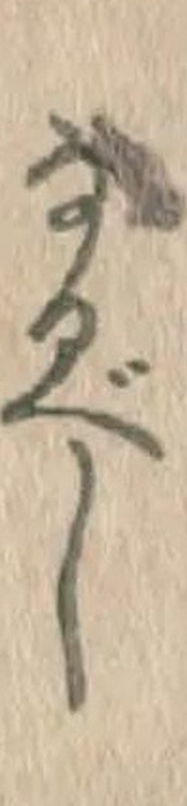なるべし
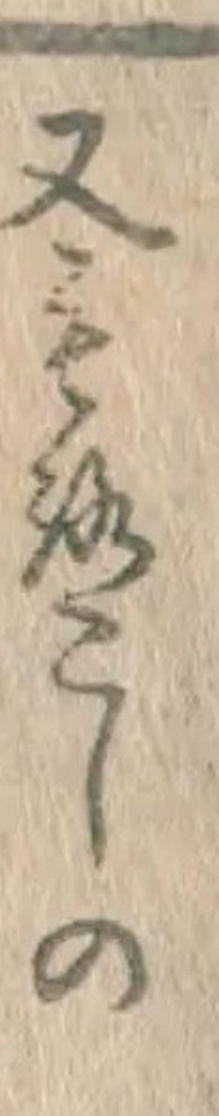又もろこしの
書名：養蚕秘録 3巻. [1]
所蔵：国立国会図書館 National Diet Library, JAPAN
